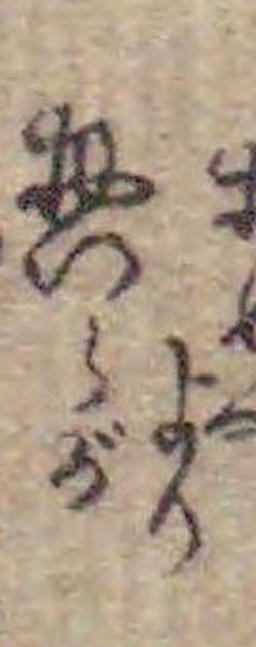おいらが
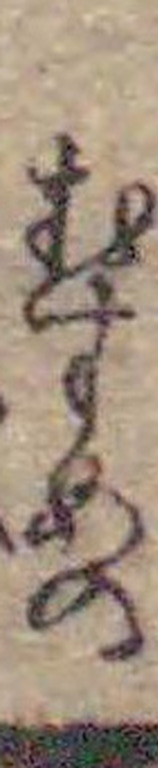むすめの
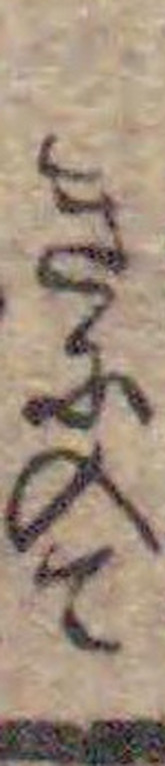きに入て
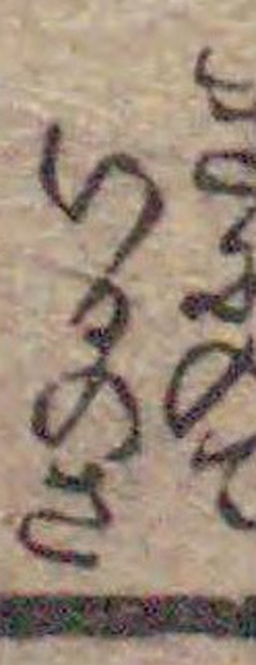いるのさ

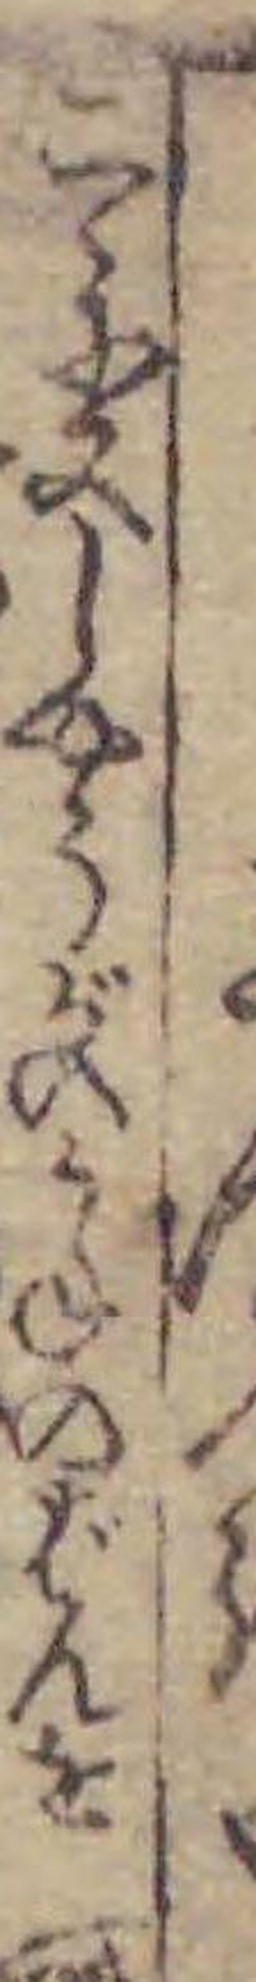こゝに又しやうがいかねのばんを
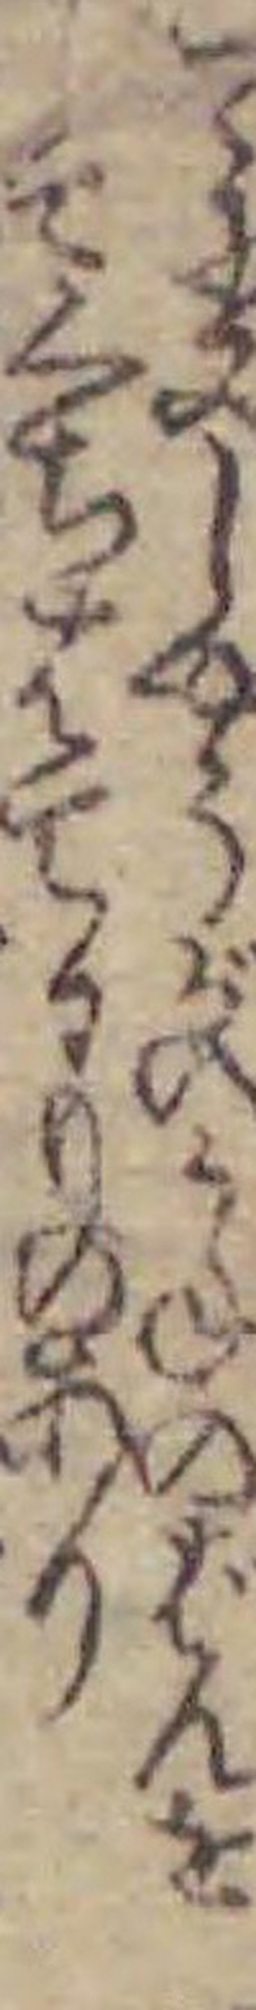してくちはてるものあり
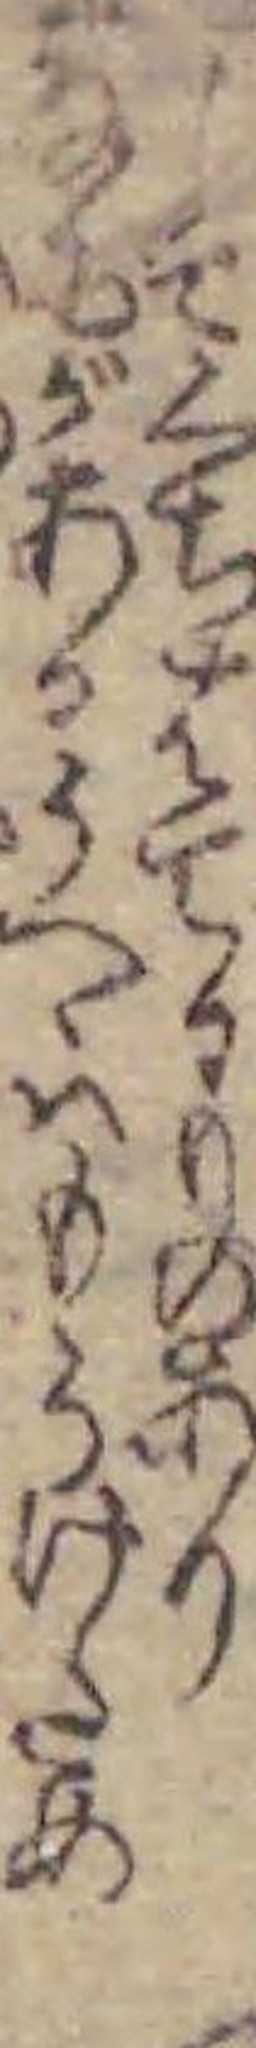なにがあるうへゝはもうけため
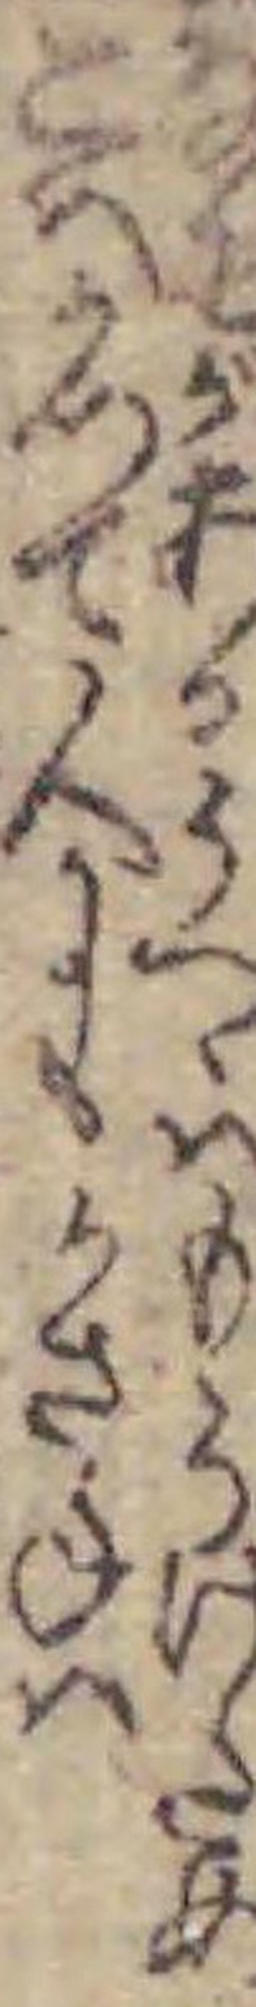こはかつて人にもかさねは
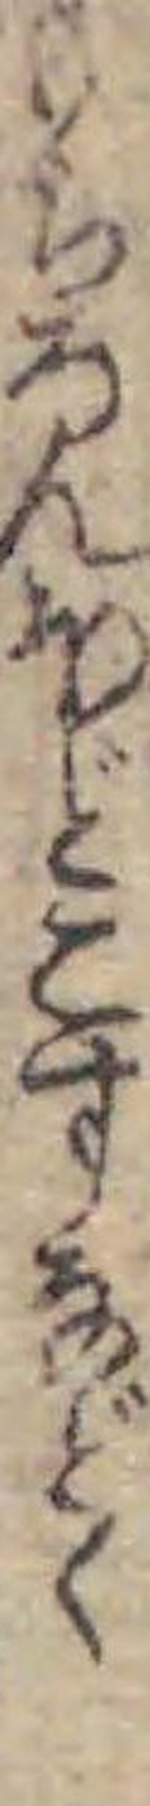もちろんほどこすなどゝ
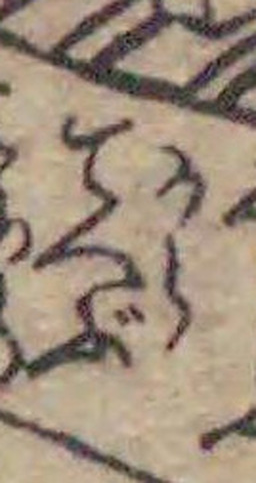てへぶ
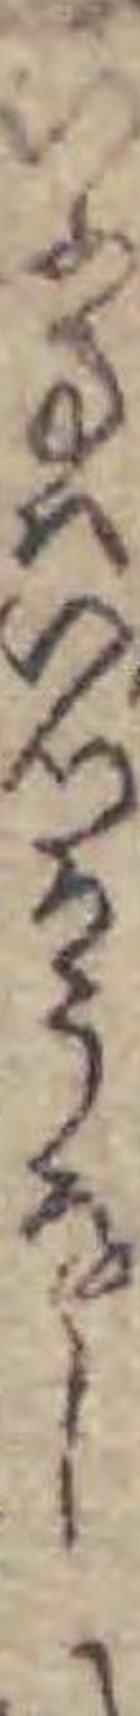いふ事はいつかうなし
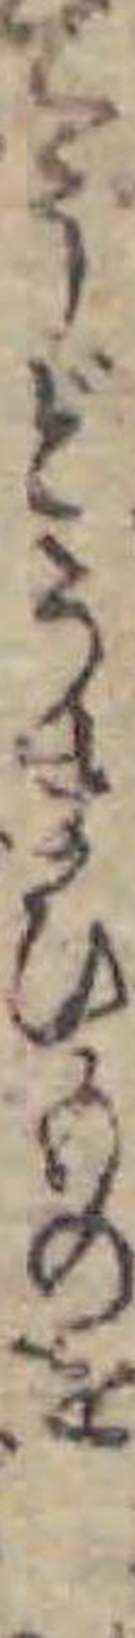てうどうまひものを
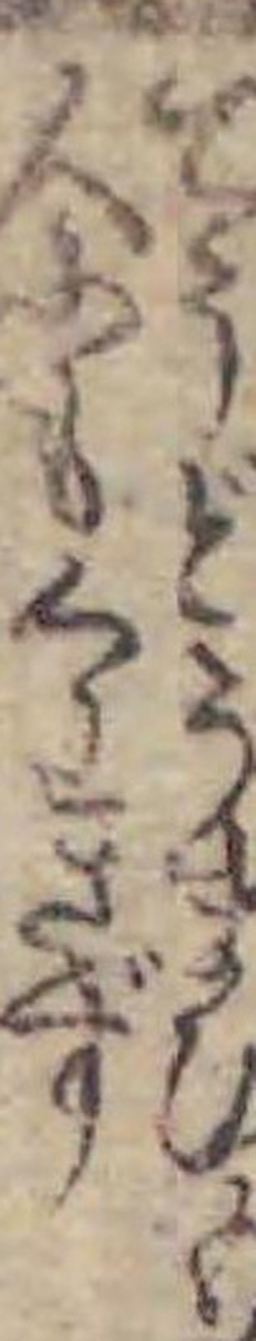人にもくわさず
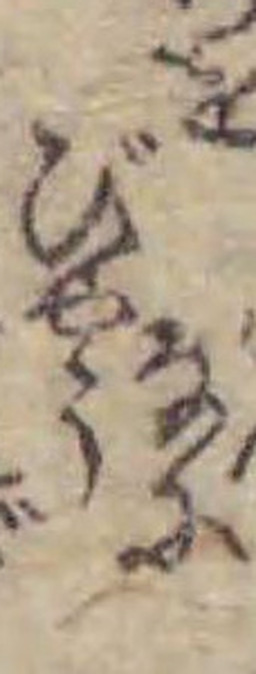びやう
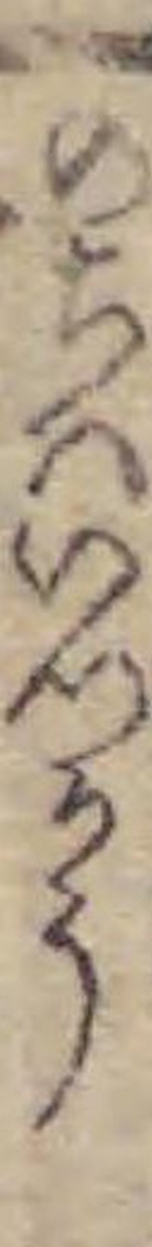のちはいつかう
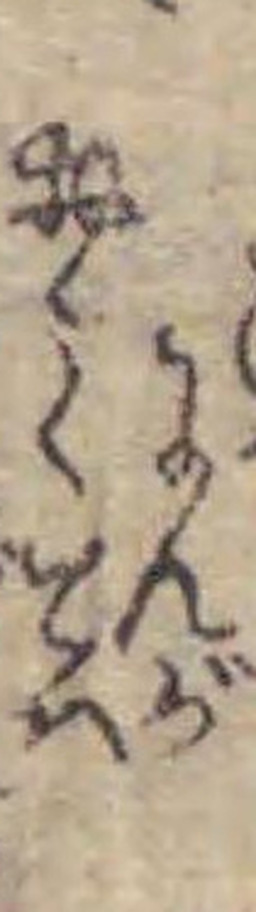おゝくては
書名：新鋳小判 : 3巻
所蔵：国立国会図書館 National Diet Library, JAPAN
